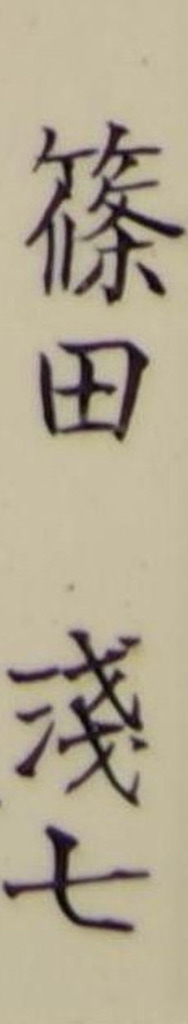篠田浅七
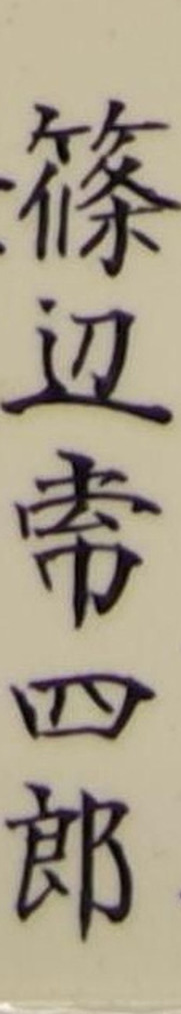篠辺常四郎
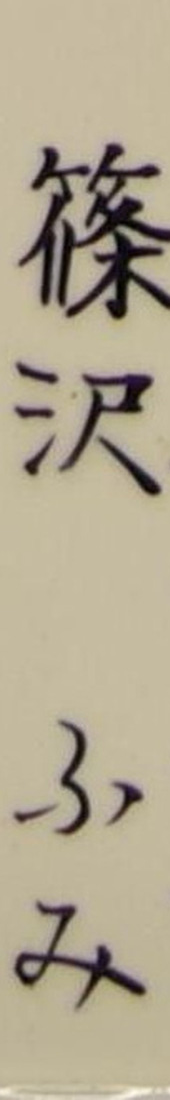篠沢ふみ
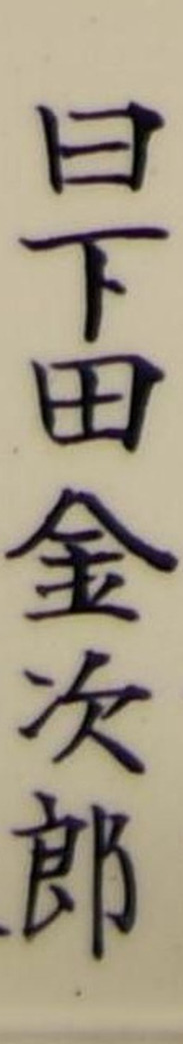日下田金次郎
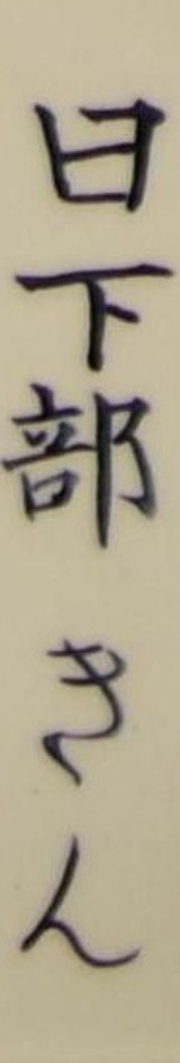日下部きん
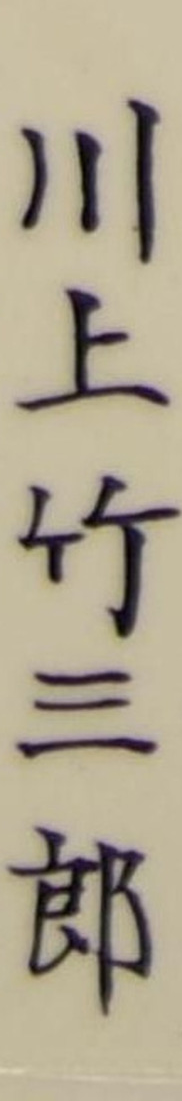川上竹三郎
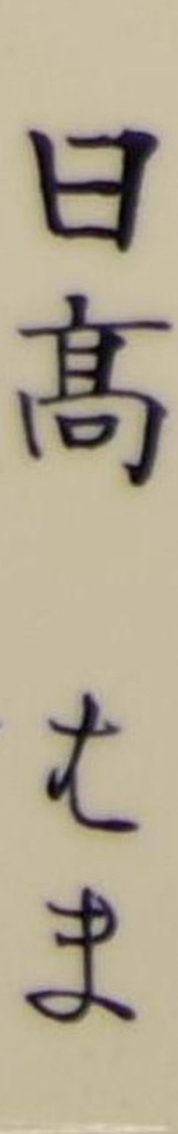日高はま
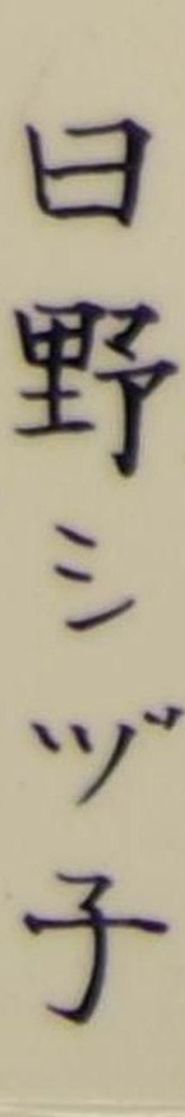日野シヅ子
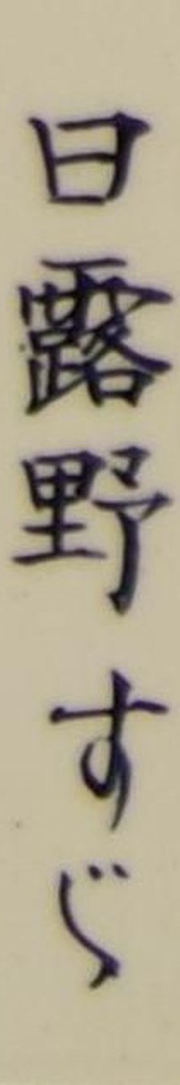日露野すず
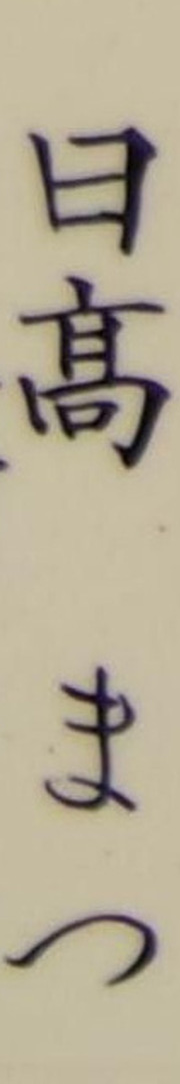日高まつ
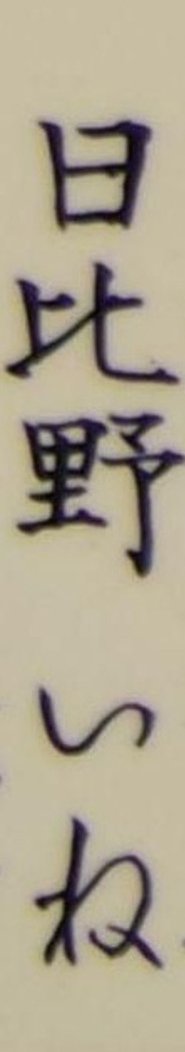日比野いね
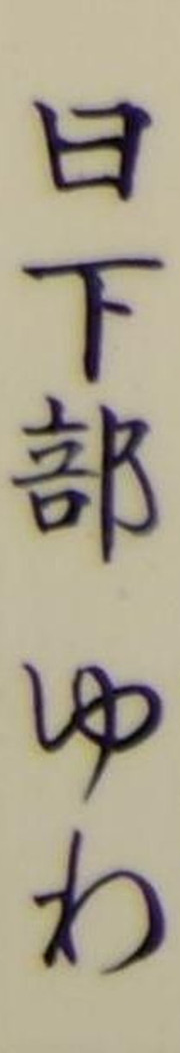日下部ゆわ

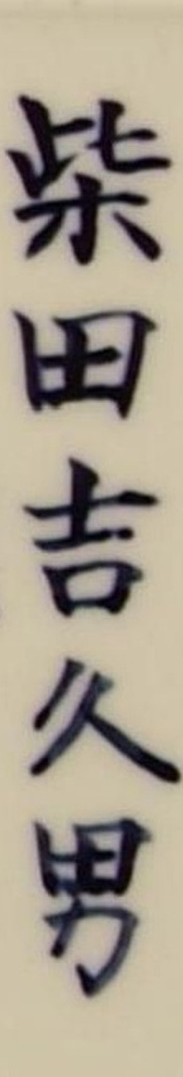柴田吉久男
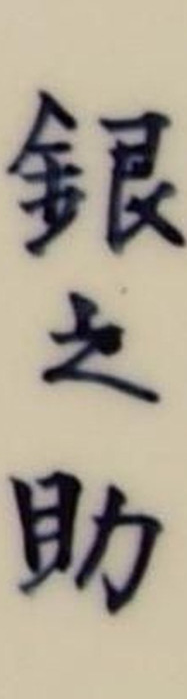銀之助
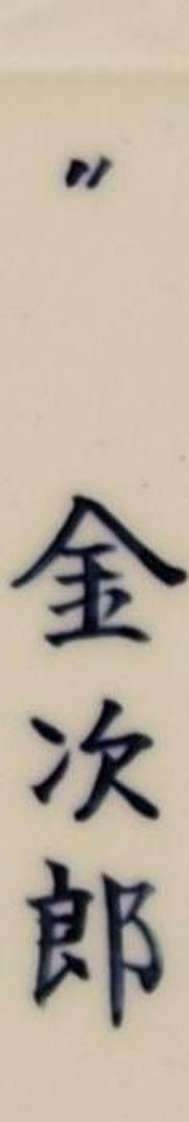金次郎
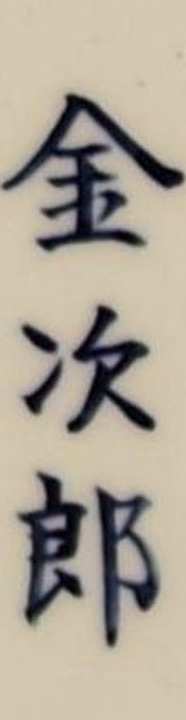金次郎
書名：A~D
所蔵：koyasan kongobuji
